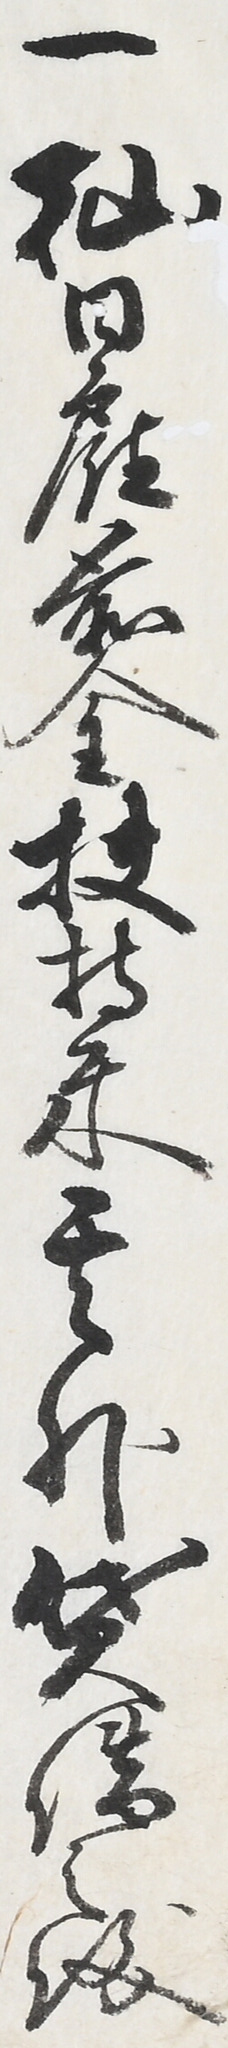一杣日雇前金扶持米其外貸借之儀
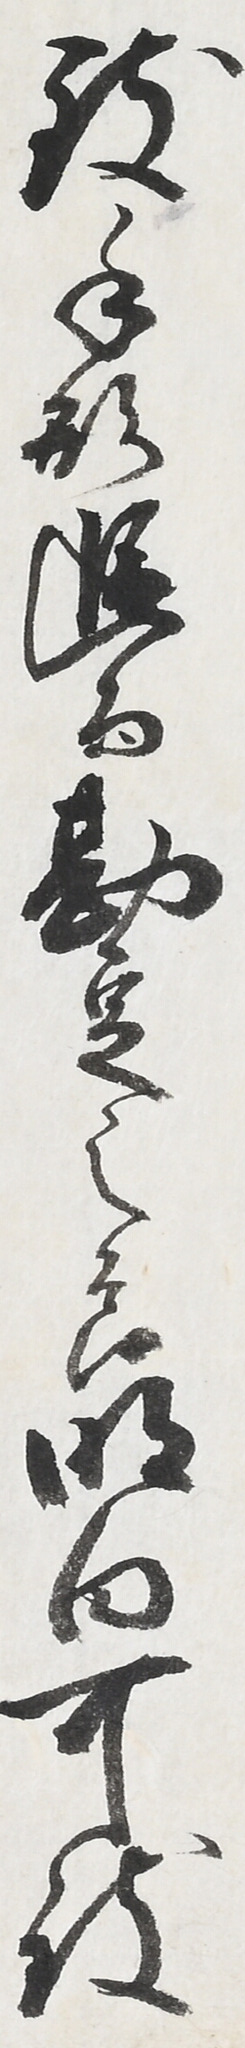致手形追而勘定之節明白可致
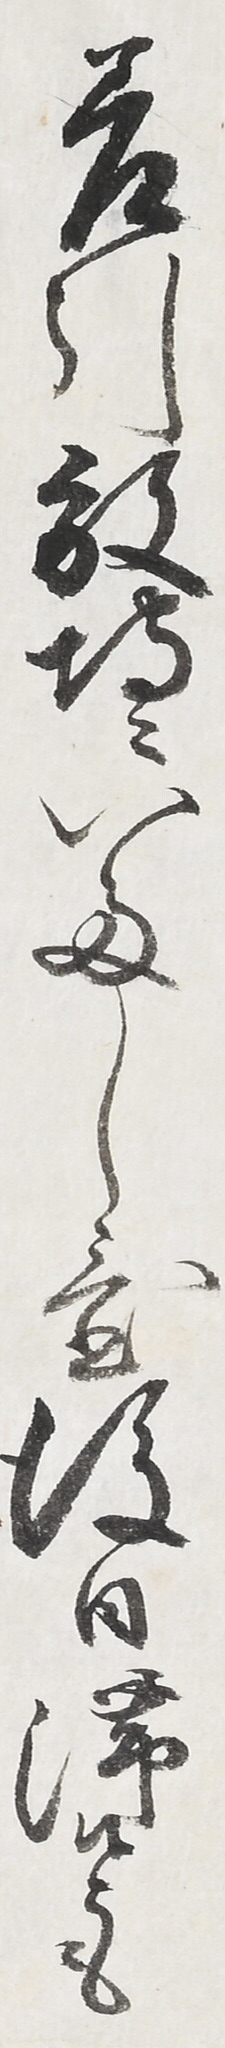差引放埒ニいたし置後日滞候とも
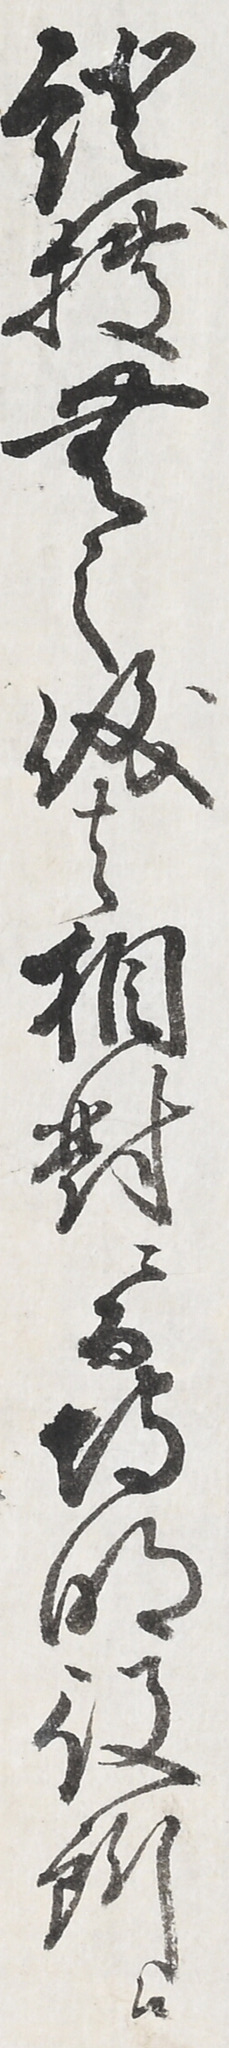証拠無之儀者相対ニ而埒明役所江
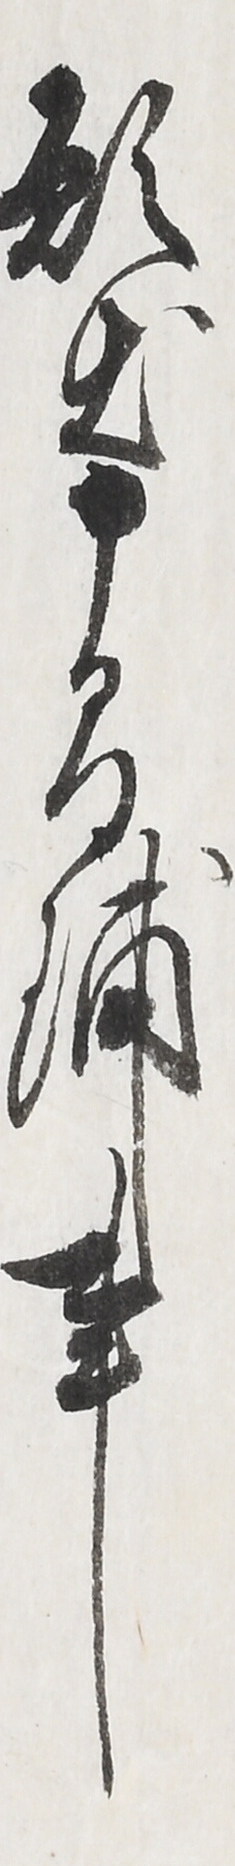願出申間敷事
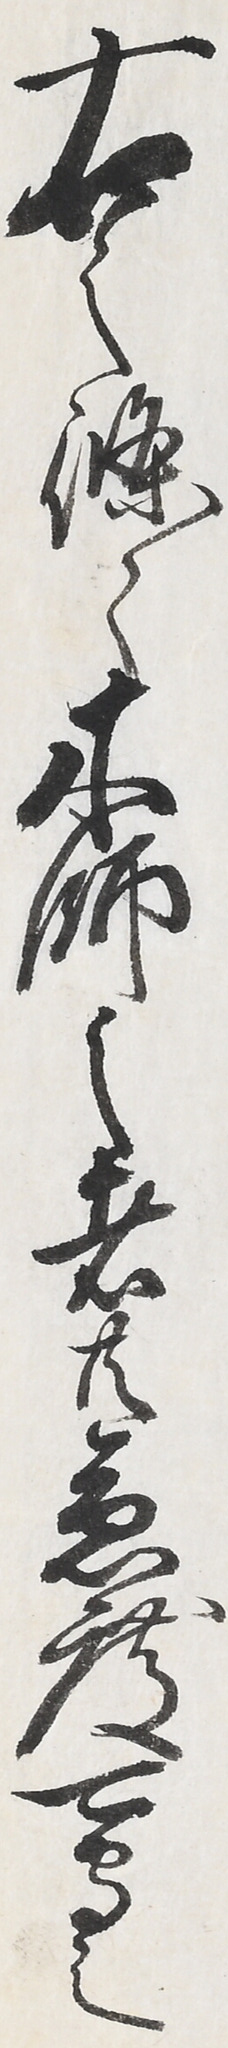右之條々木師之者共急度可守之
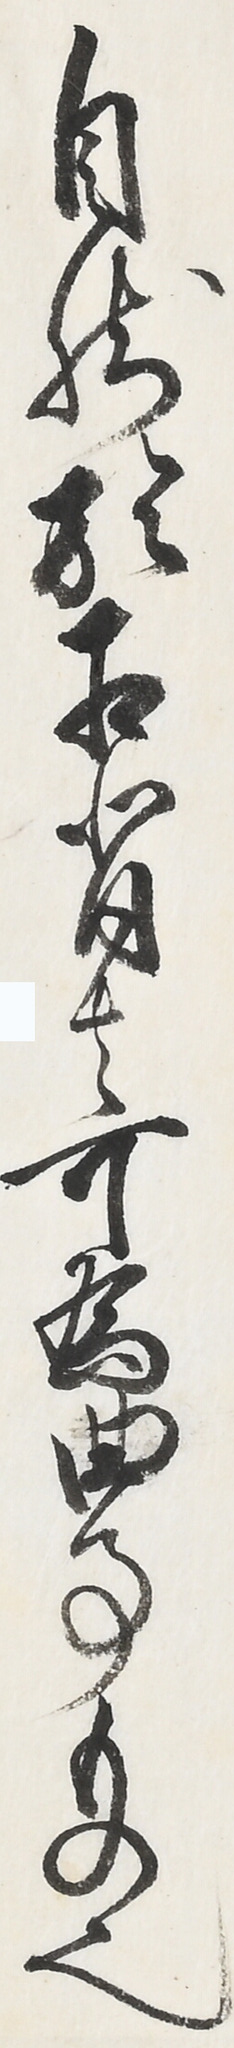自然於相背者可為曲事もの也
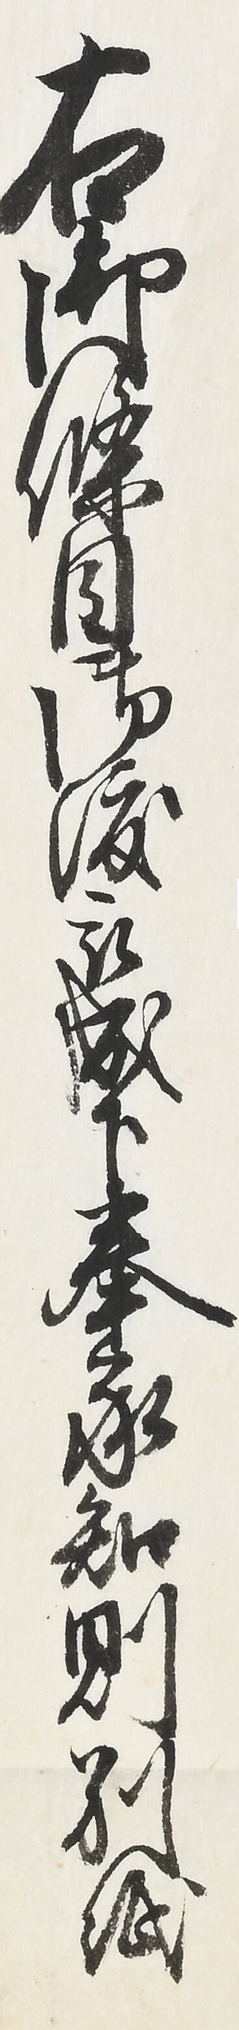右御條目御渡被成下奉承知則別紙
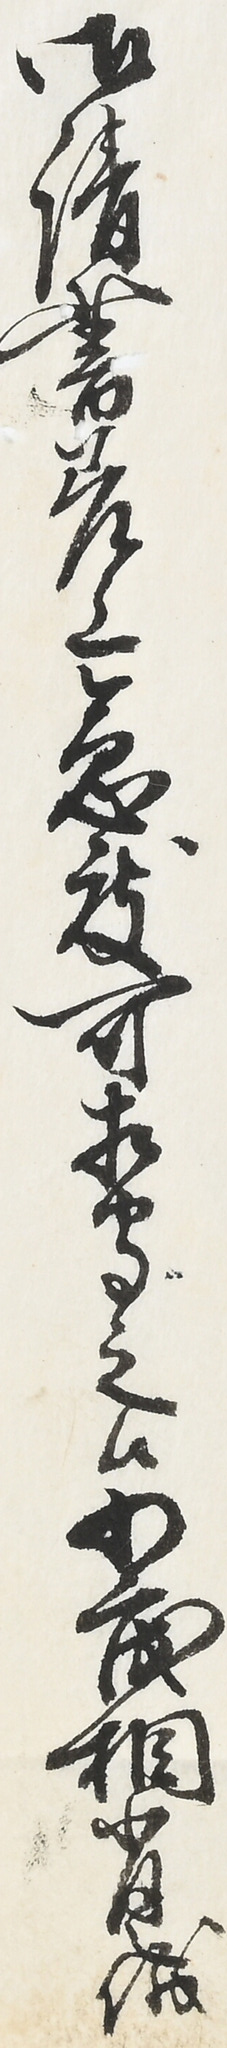請書差上急度可相守之候少茂相背儀

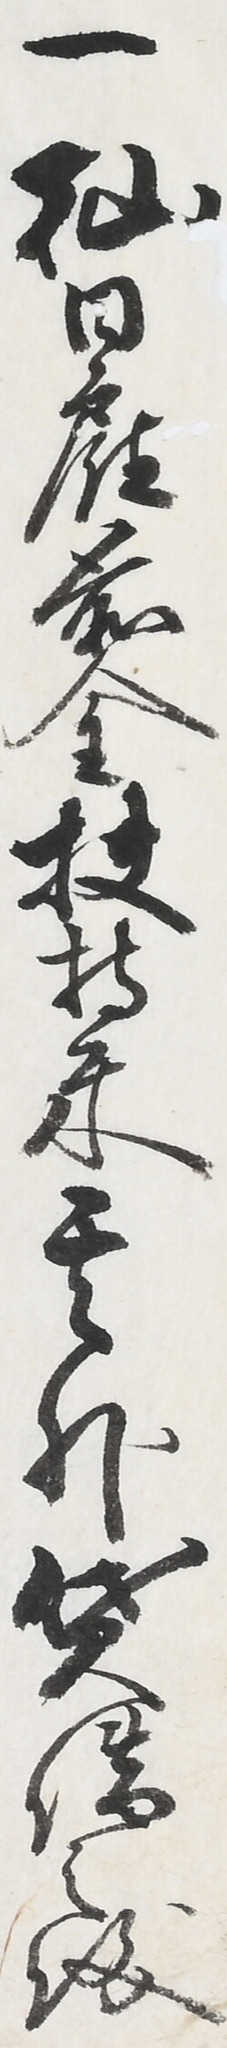一杣日雇前金扶持米其外貸借之儀
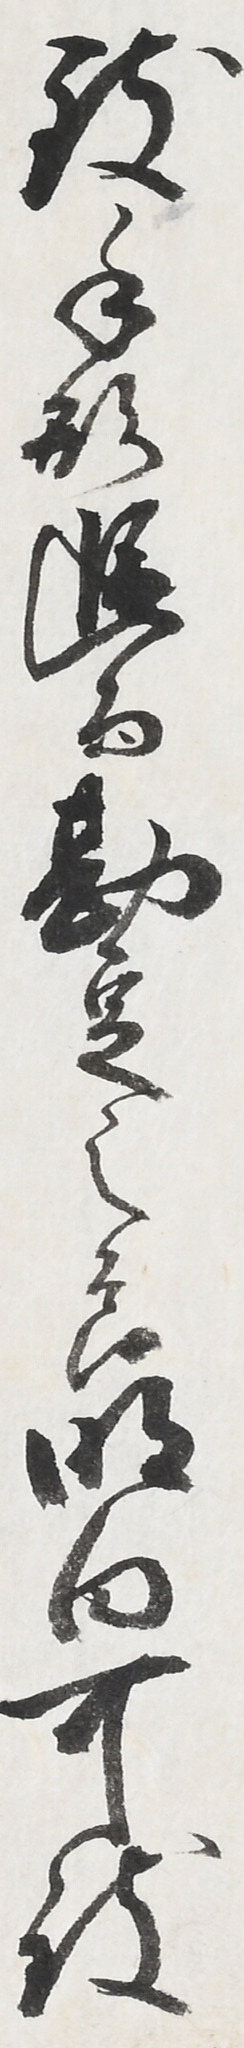致手形追而勘定之節明白可致
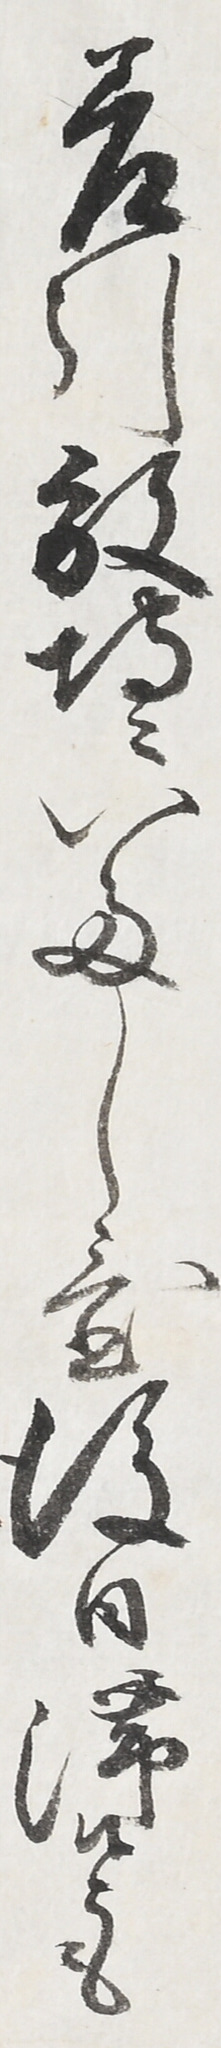差引放埒ニいたし置後日滞候とも
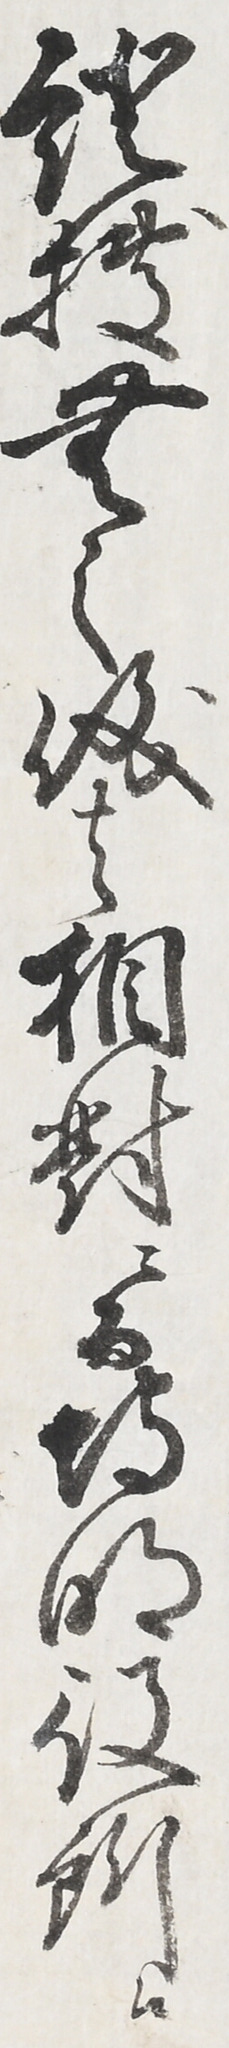証拠無之儀者相対ニ而埒明役所江
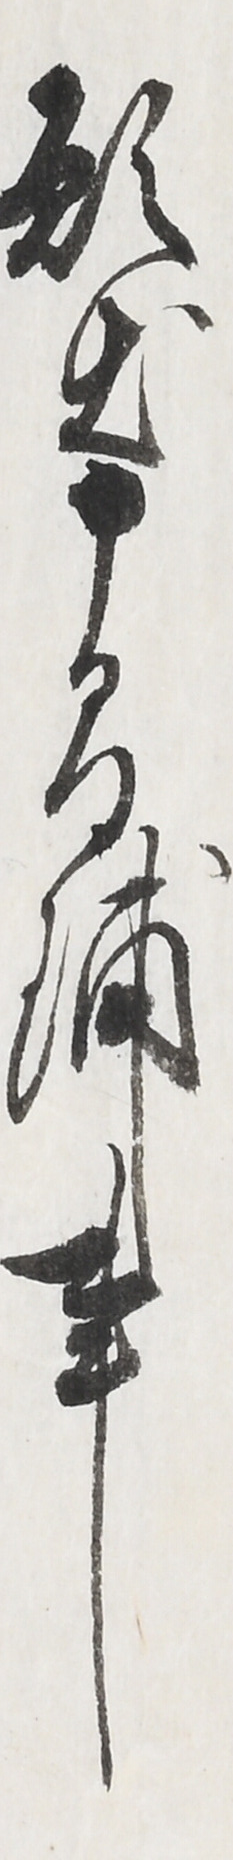願出申間敷事
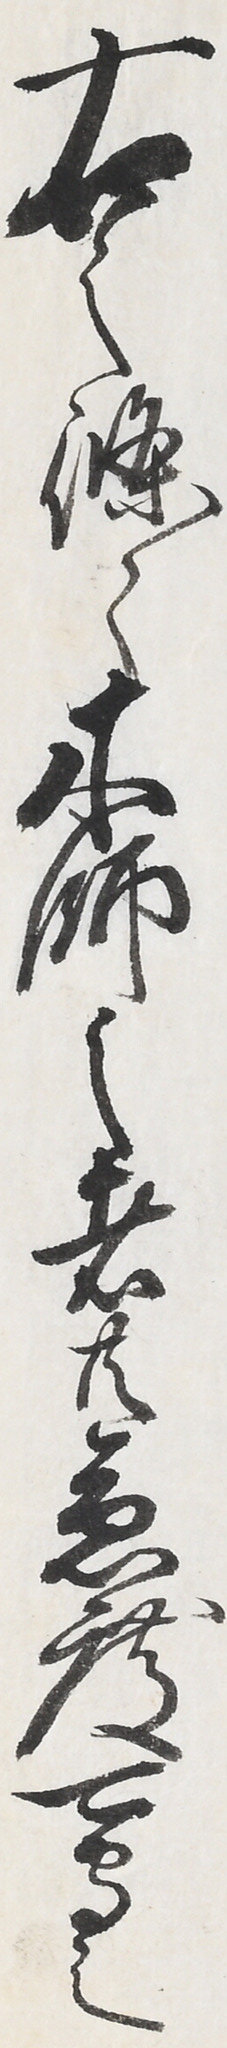右之條々木師之者共急度可守之
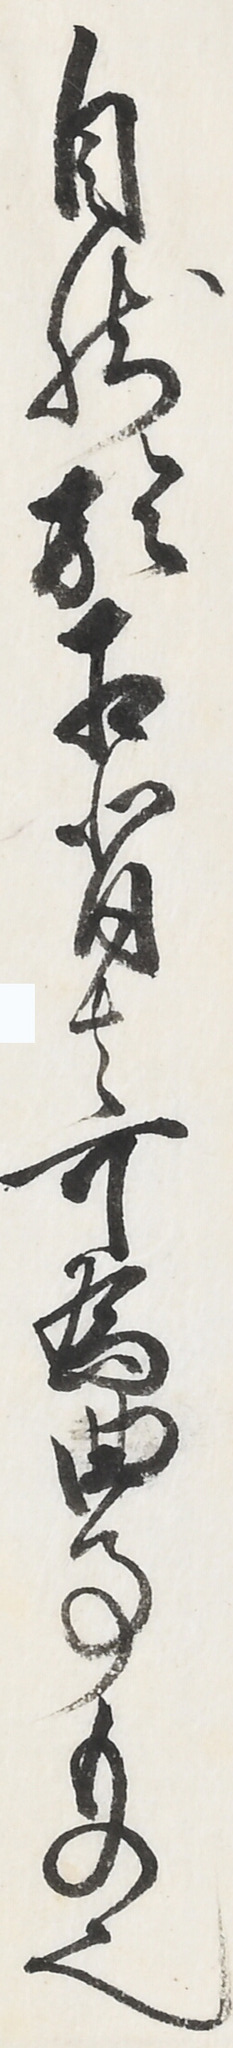自然於相背者可為曲事もの也
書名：小白木條目請書并判取帳
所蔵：伊那市立高遠町図書館・合同会社AMANE
